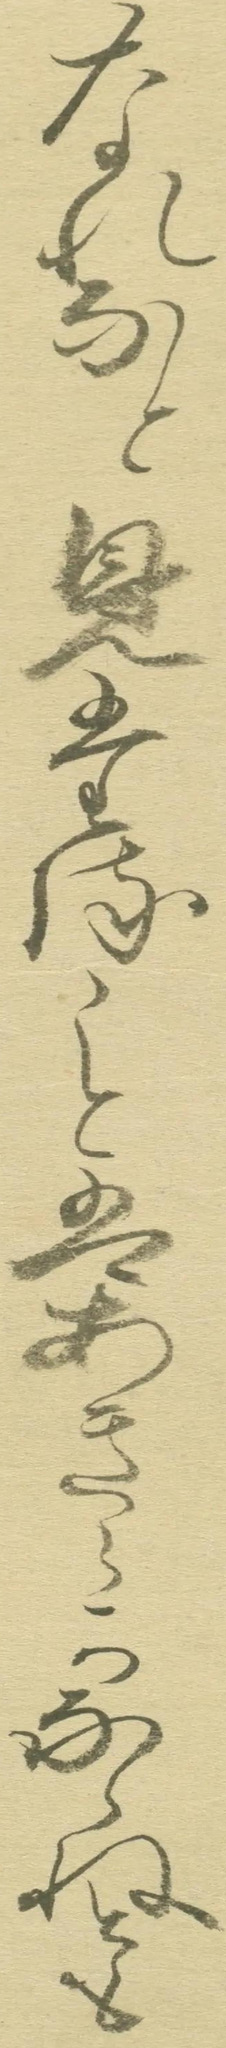なれなと見たることはあきらかならねとも
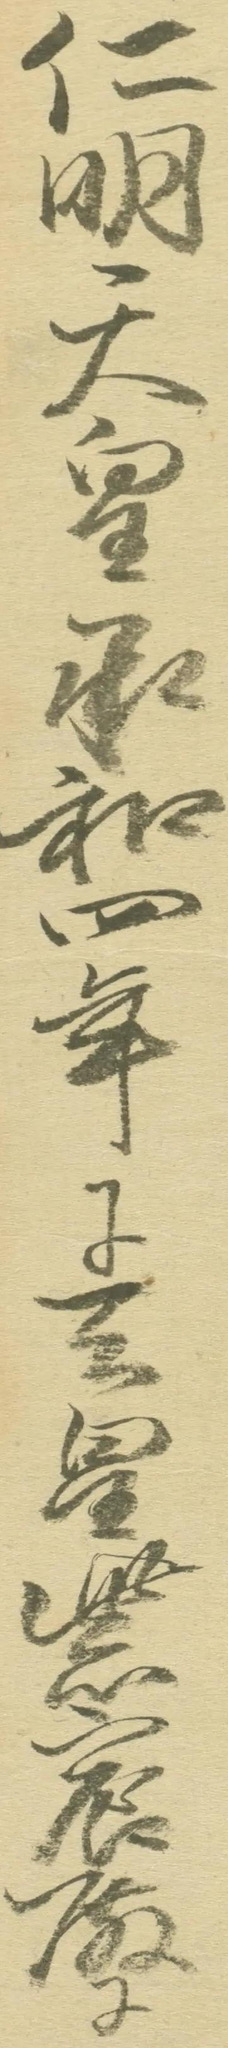仁明天皇承和四年に天皇紫宸殿に
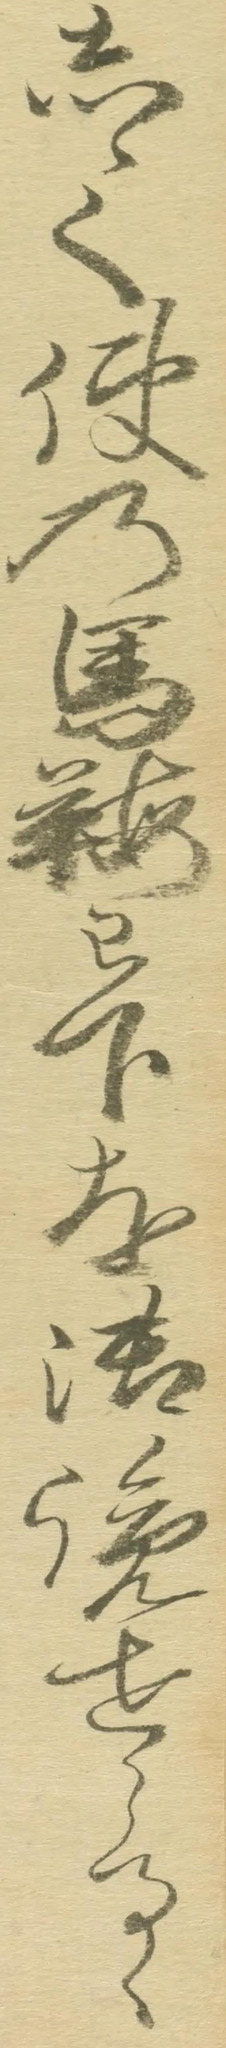して使の馬鞍已下を御覧せらるゝ
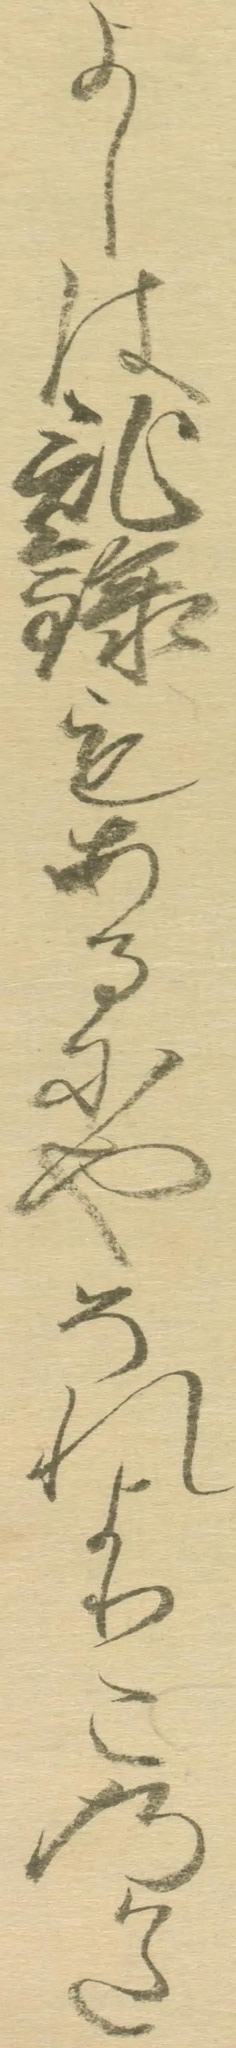よしは記録もあるにやそれよりこのかた
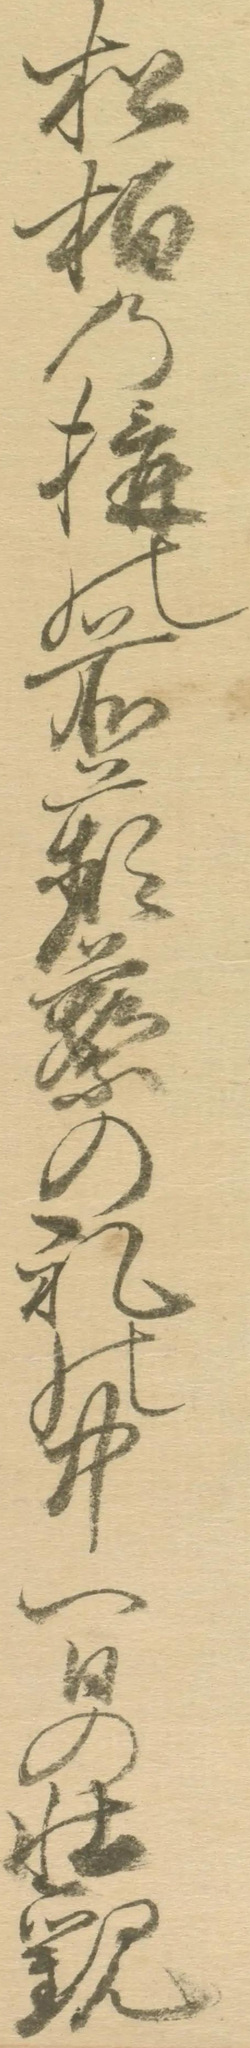松柏の搆の前蘋蔡の礼の中一日の壮観
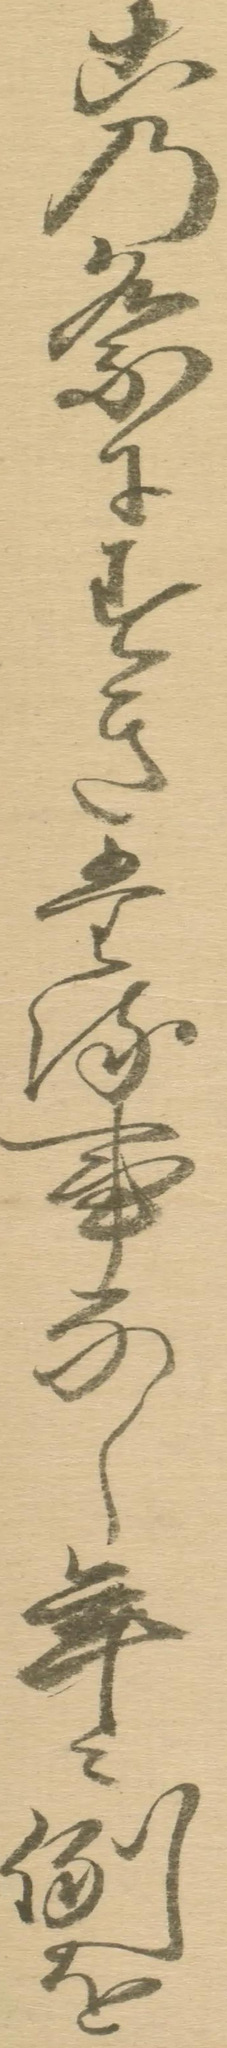この祭にすきたる事なし年々例を

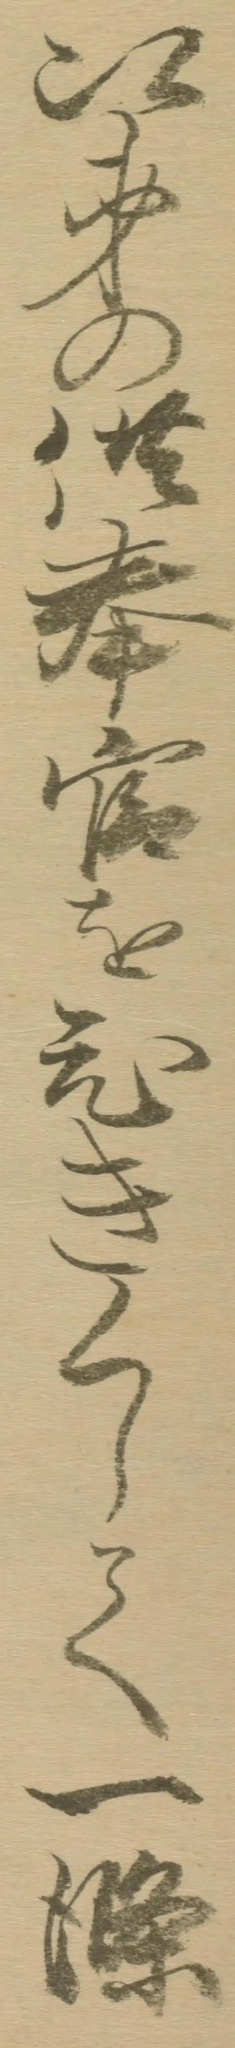次第の供奉官をひきくして一条
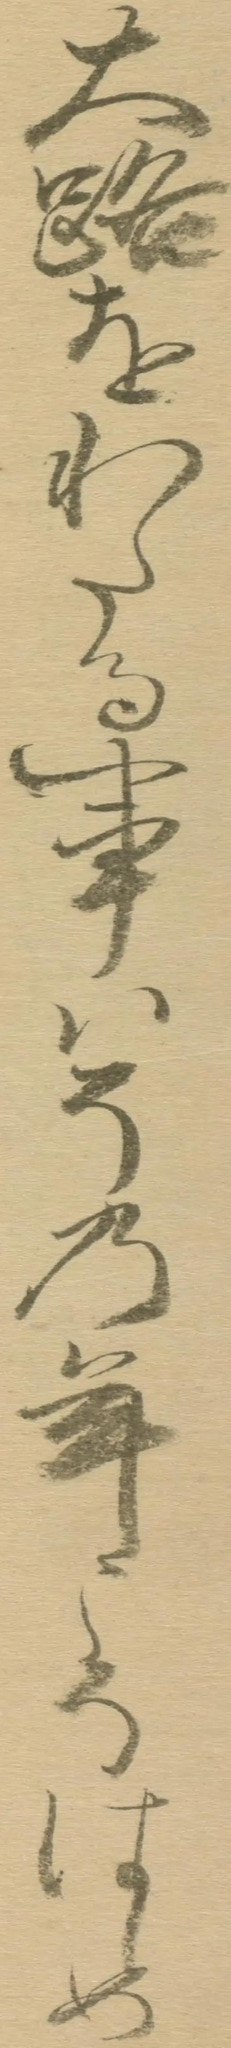大路をわたる事はその年こそはしめ
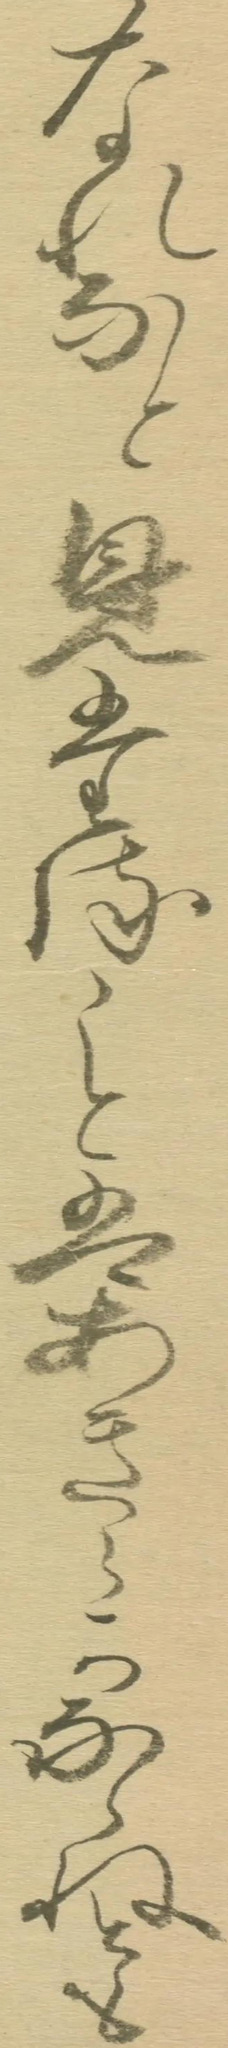なれなと見たることはあきらかならねとも
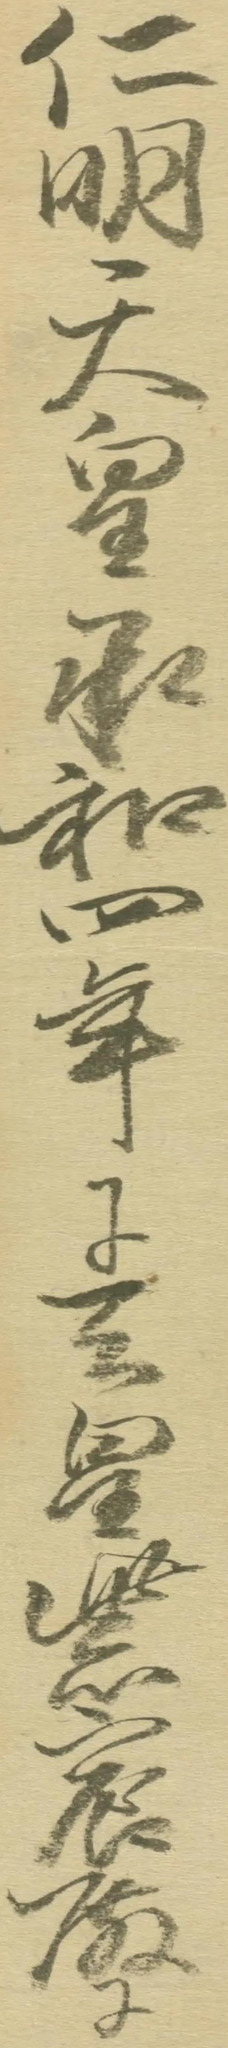仁明天皇承和四年に天皇紫宸殿に
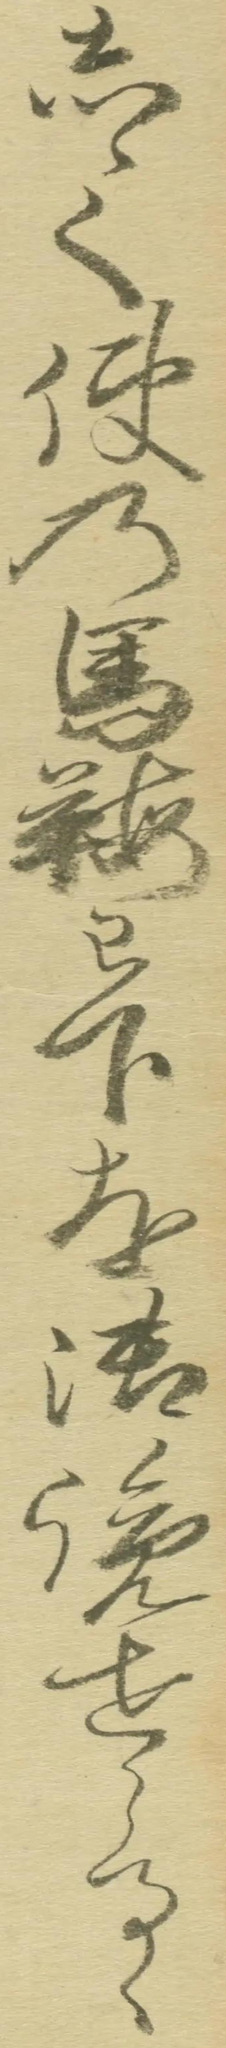して使の馬鞍已下を御覧せらるゝ
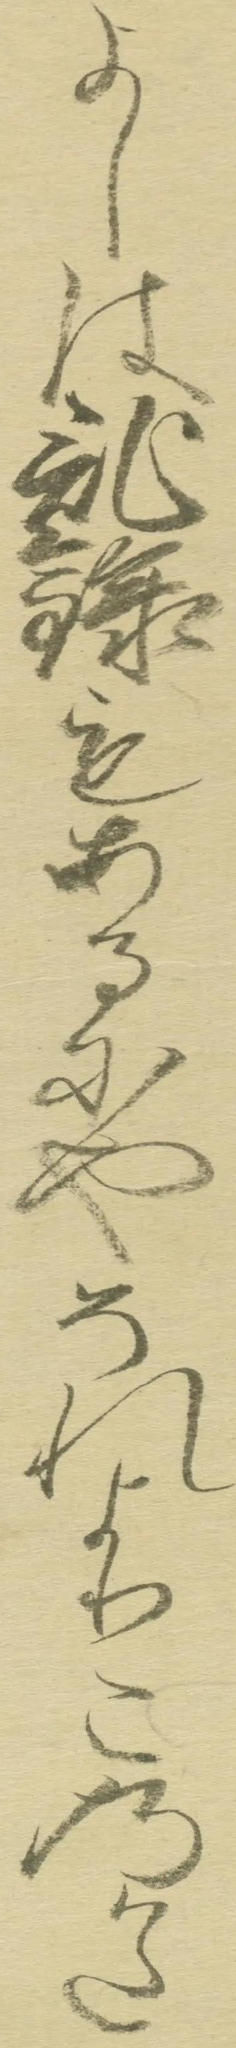よしは記録もあるにやそれよりこのかた
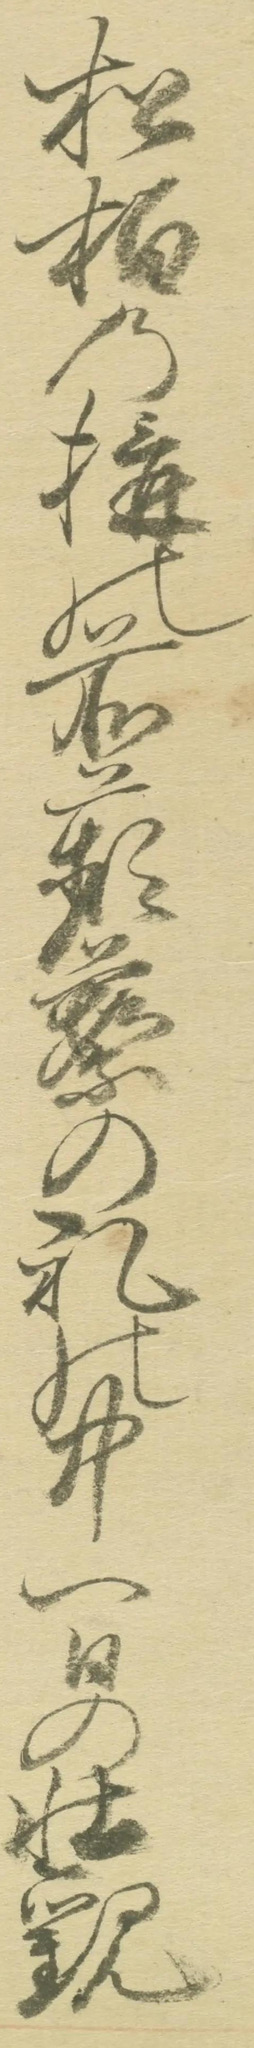松柏の搆の前蘋蔡の礼の中一日の壮観
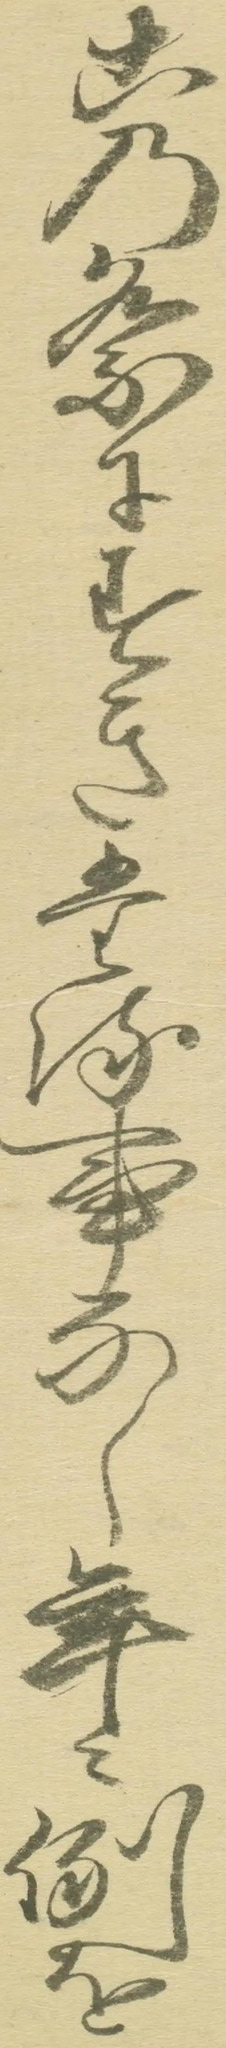この祭にすきたる事なし年々例を
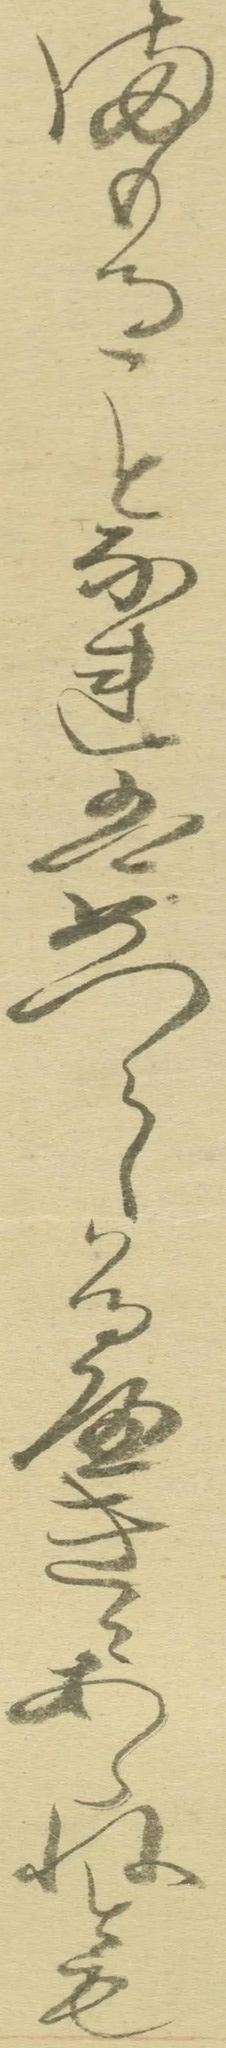まもることなれはめつらしかるへきにあらねとも
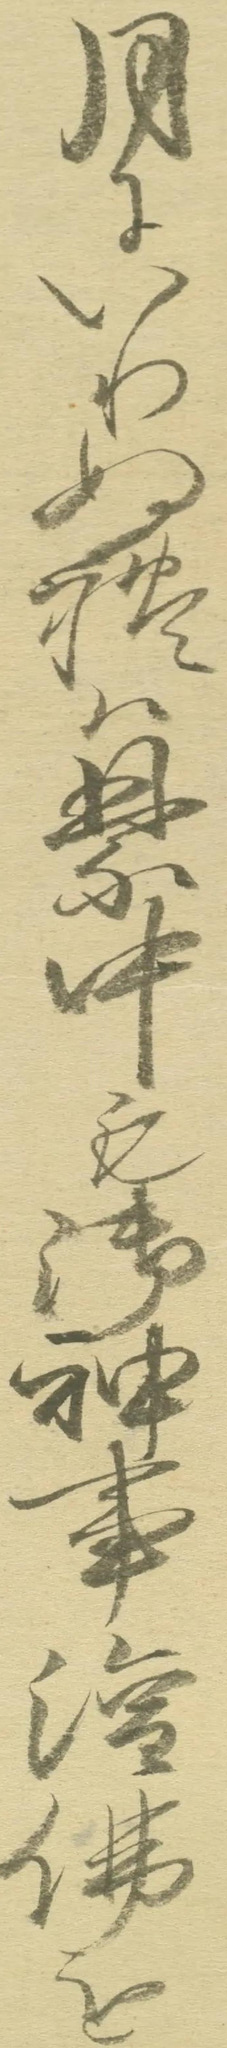月にいりぬれは禁中も御神事潅仏を
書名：賀茂祭縁起
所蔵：国立国会図書館 National Diet Library, JAPAN
